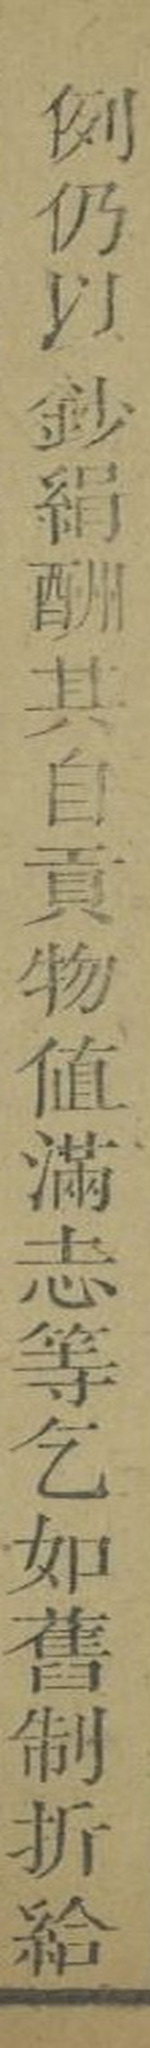例仍以鈔絹酬其自貢物値満志等乞如旧制折給
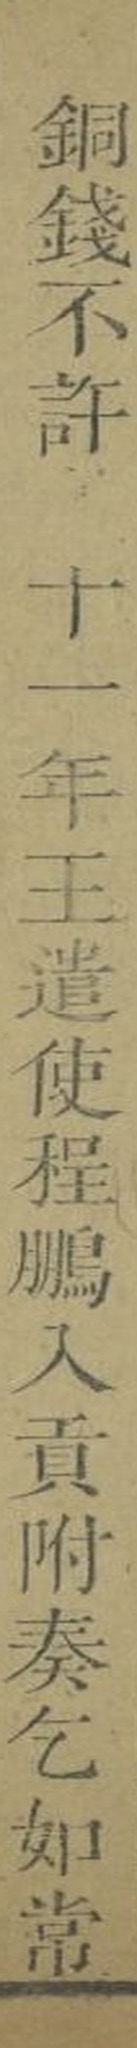銅銭不許十一年王遣使程鵬入貢附奏乞如常
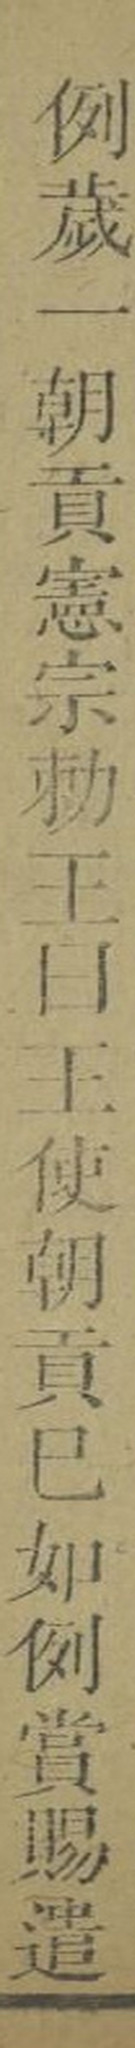例歳一朝貢憲宗勅王曰王使朝貢巳如例賞賜遣
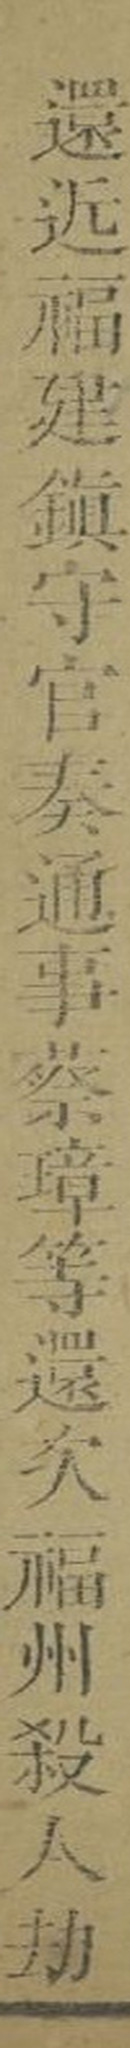還近福建鎮守官奏通事蔡璋等還次福州殺人劫
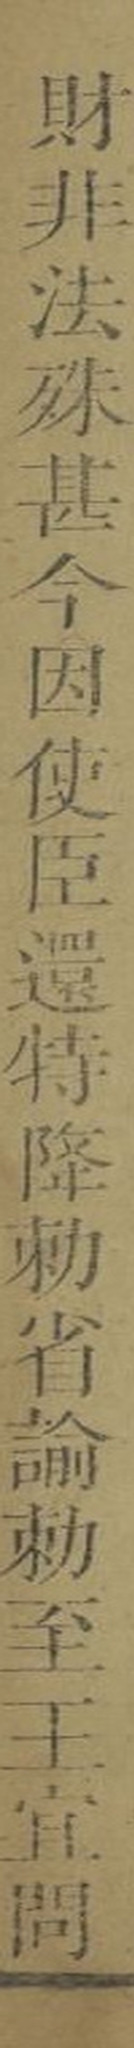財非法殊甚今因使臣還特降勅省諭勅至王宜問

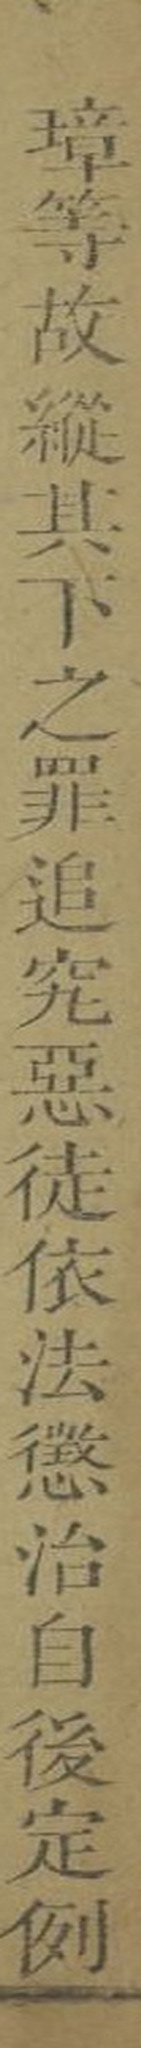璋等故縦其下之罪追究悪徒依法懲治自後定例
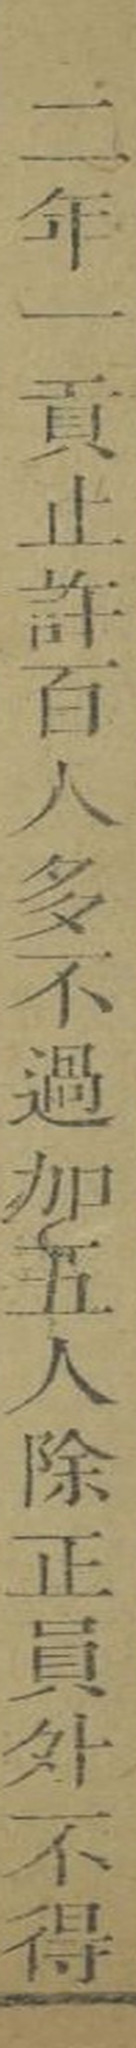二年一貢止許百人多不過加五人除正員外不得
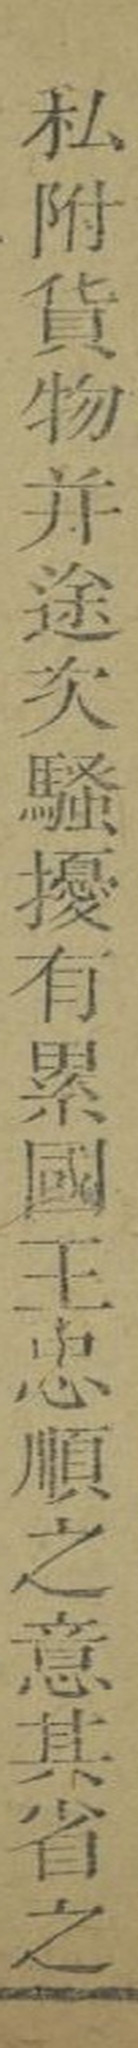私附貨物并途次騒擾有累国王忠順之意其省之
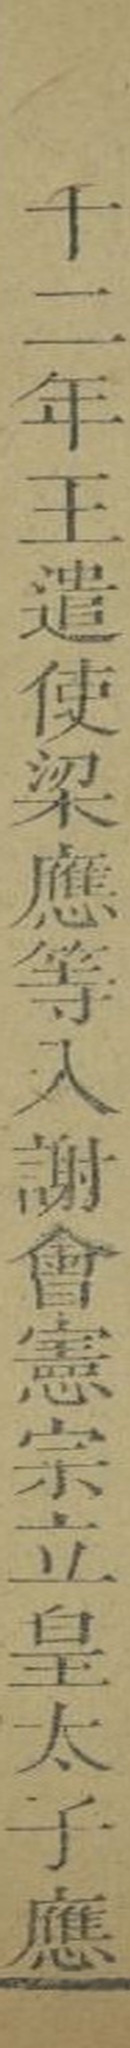十二年王遣使梁応等入謝会憲宗立皇太子応
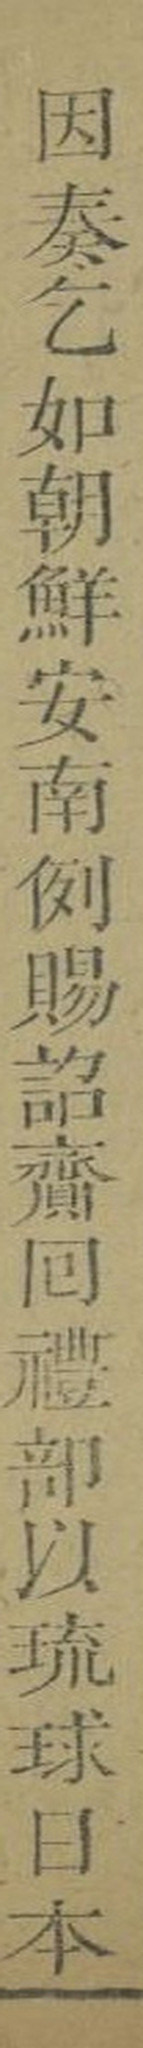因奏乞如朝鮮安南例賜詔齎回礼部以琉球日本
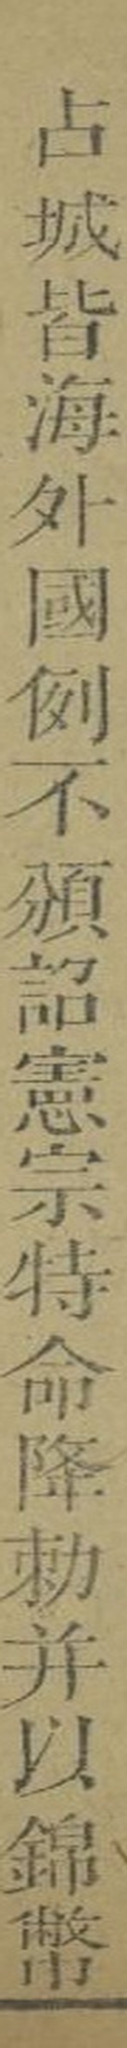占城皆海外国例不頒詔憲宗特命降勅并以錦幣
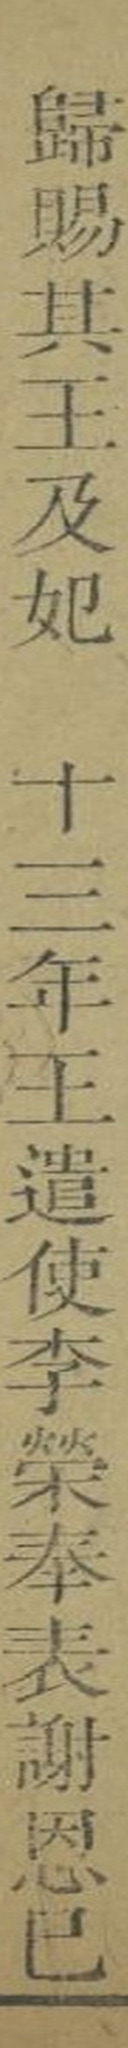帰賜其王及妃十三年王遣使李栄奉表謝恩巳
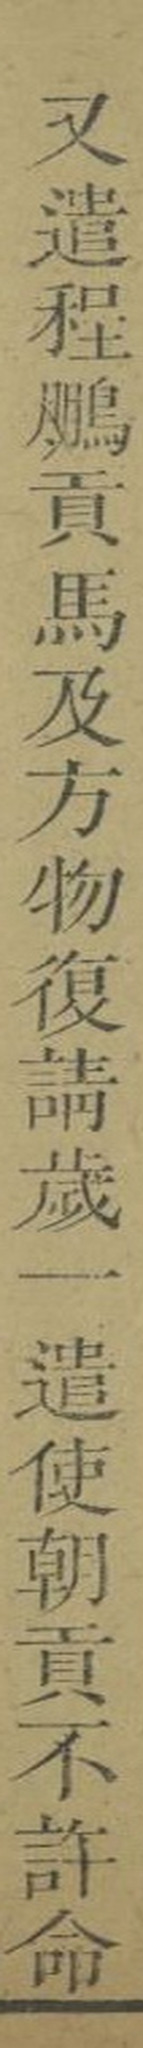又遣程鵬貢馬及方物復請歳一遣使朝貢不許命
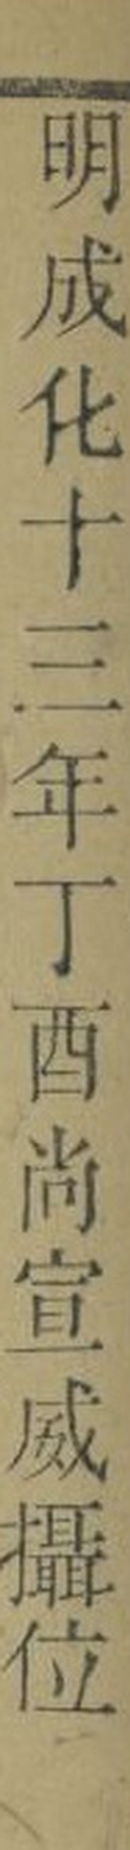明成化十三年丁酉尚宣威摂位
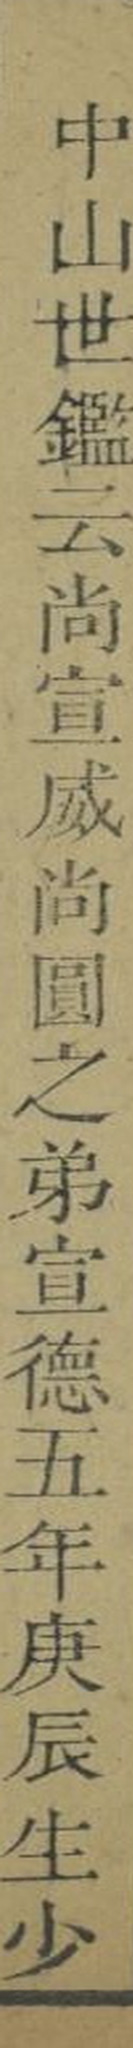中山世鑑云尚宣威尚円之弟宣徳五年庚辰生少
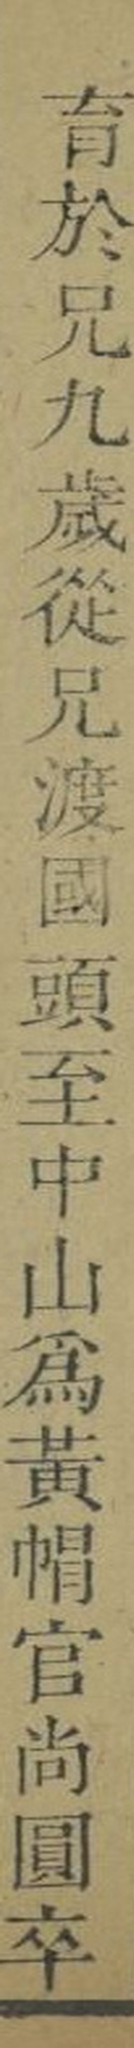育於兄九歳従兄渡国頭至中山為黄帽官尚円卒
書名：中山伝信録 巻三
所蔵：University of the Ryukyus Library
